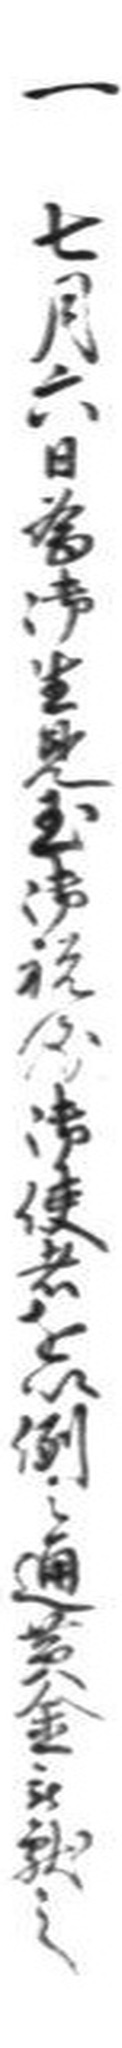一七月六日為御生見玉御祝儀御使者を以例之通黄金被献之
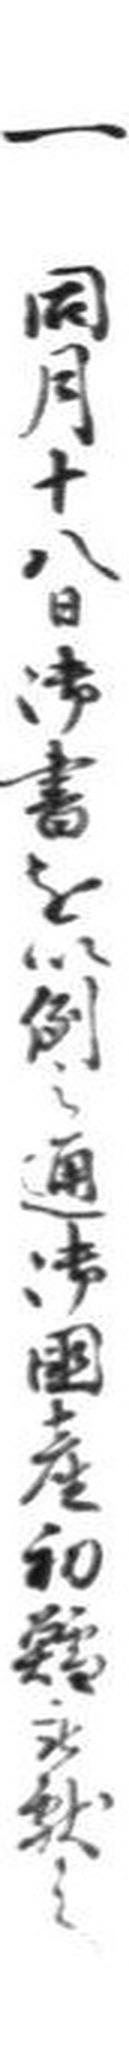一同月十八日御書を以例之通御国産初鱈被献之
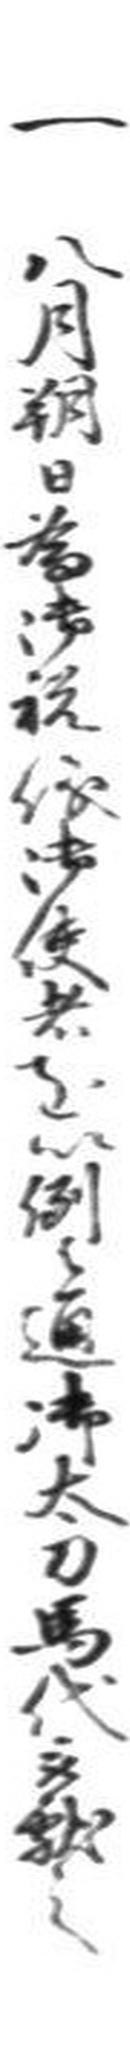一八月朔日為御祝儀御使者を以例之通御太刀馬代被献之
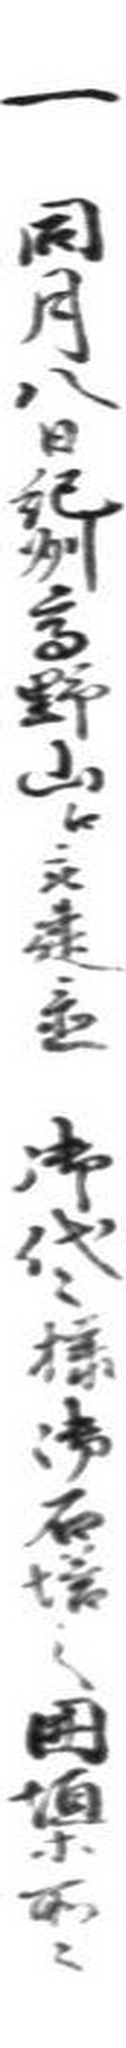一同月八日紀州高野山江被建置御代々様御石塔之囲垣等所々
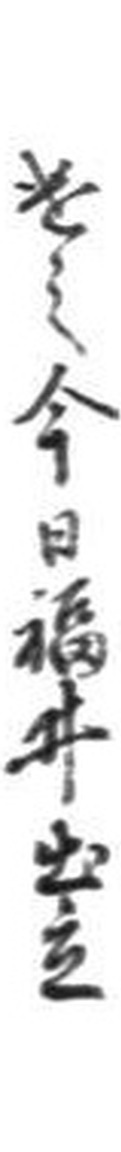遣之今日福井出立
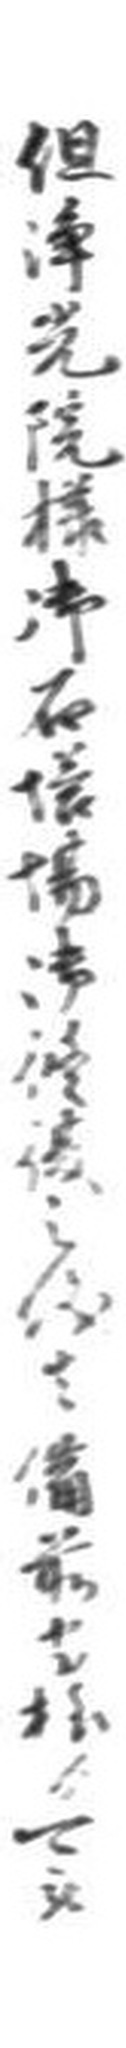但浄光院様御石塔場御修復之儀者備前守様ゟ可被
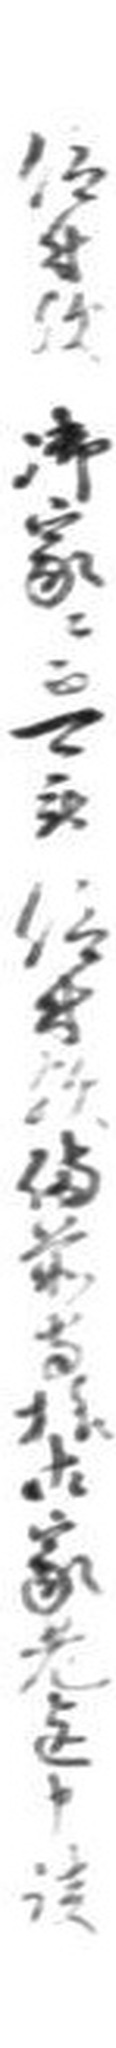仰付歟御家ニ而可被仰付歟備前守様御家老迄申談
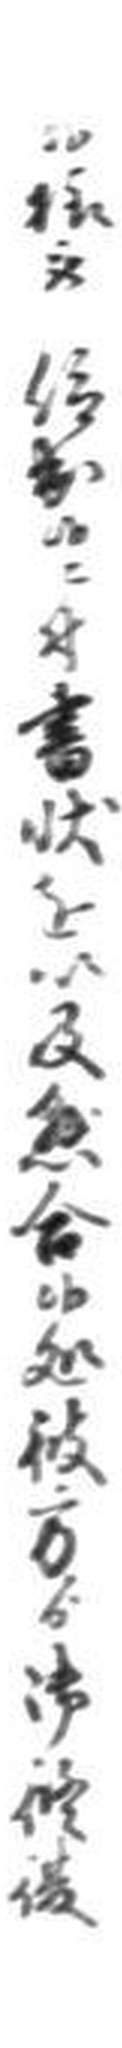候様被仰出候ニ付書状を以及懸合候処彼方ゟ御修復
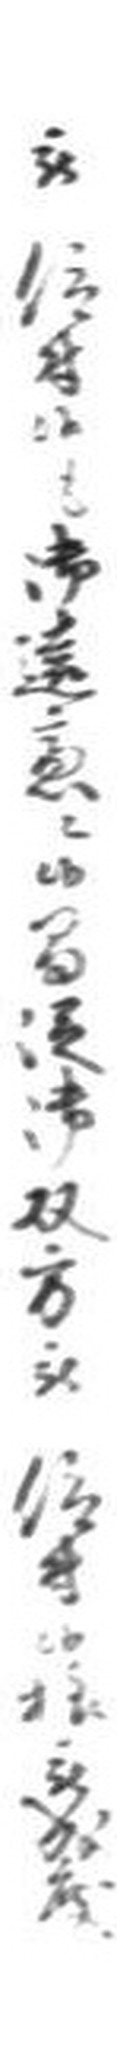被仰付候も御遠慮ニ候間従御双方被仰付候様被成度

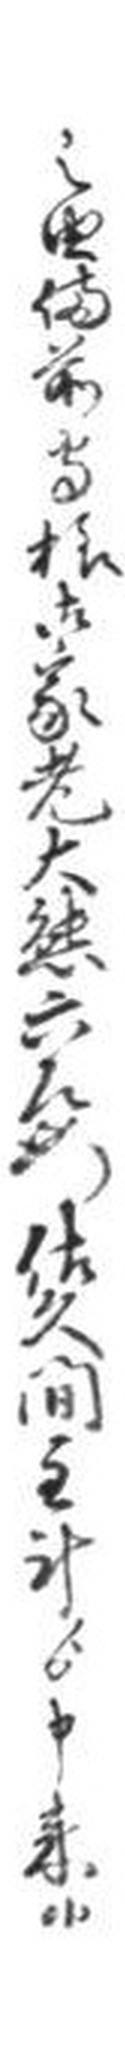之由備前守様御家老大熊六左衛門佐久間主計ゟ申来候
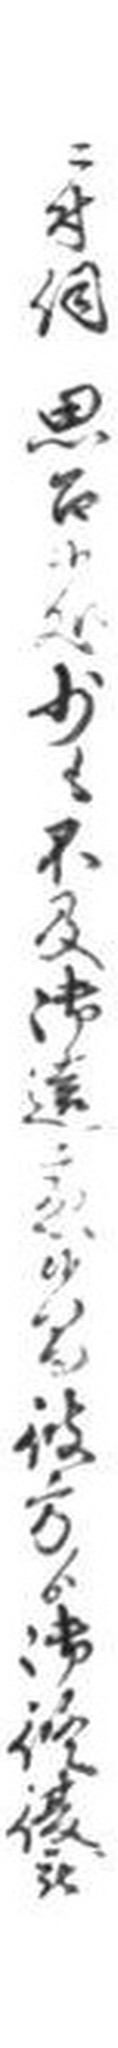ニ付伺思召候処少も不及御遠慮候間彼方ゟ御修復被
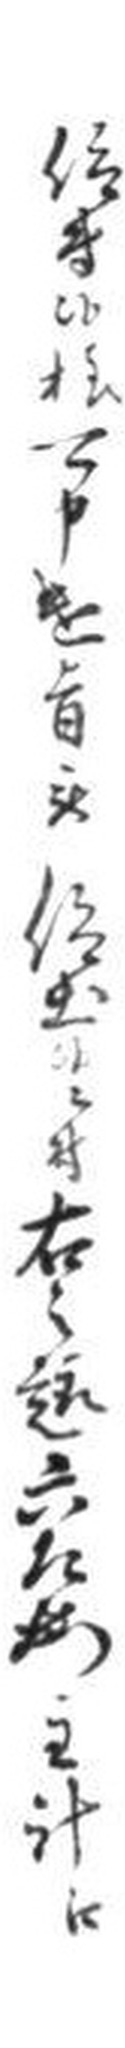仰付候様可申遣旨被仰出候ニ付右之趣六左衛門主計江
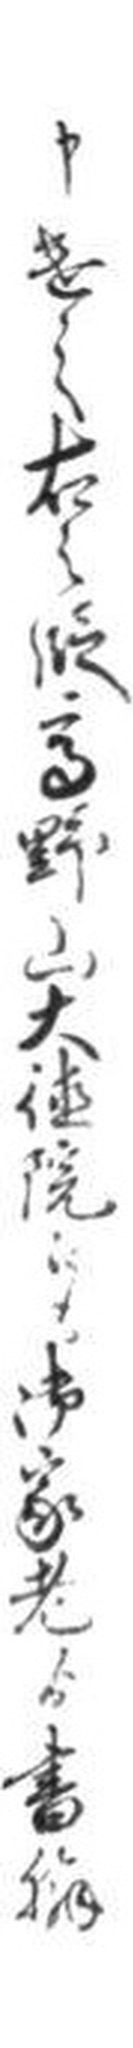申遣之右之段高野山大徳院江も御家老ゟ書翰
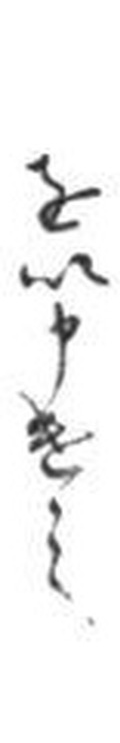を以申遣之
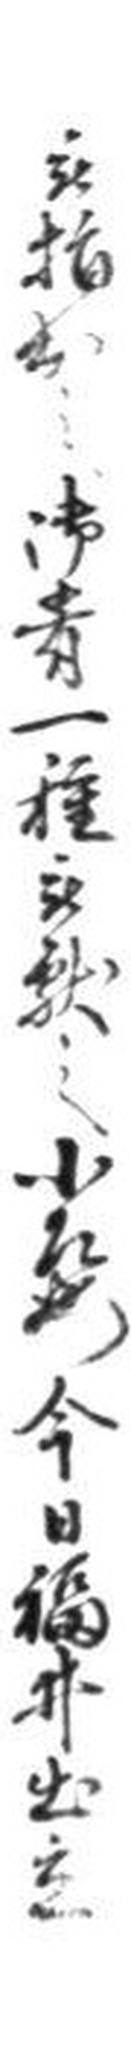被指出之御肴一種被献之小左衛門今日福井出立
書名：家譜 二十二 吉品公 従元禄十五年到同十六年
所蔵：福井県文書館 Fukui Prefectural Archives
